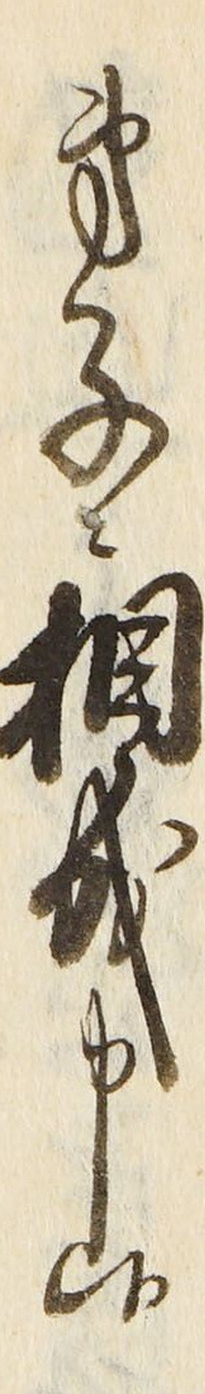弟子ニ相成申候
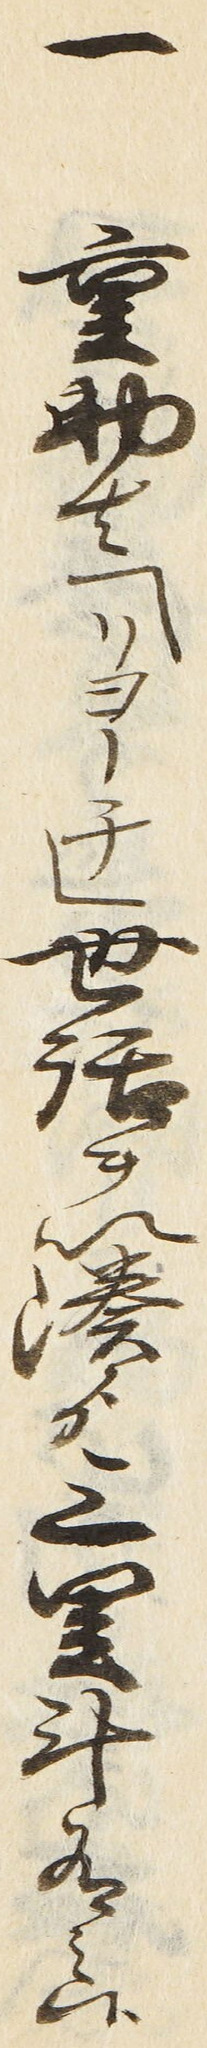一重助者「リヨーナ」世話ヲ以湊ゟ三里斗有之候
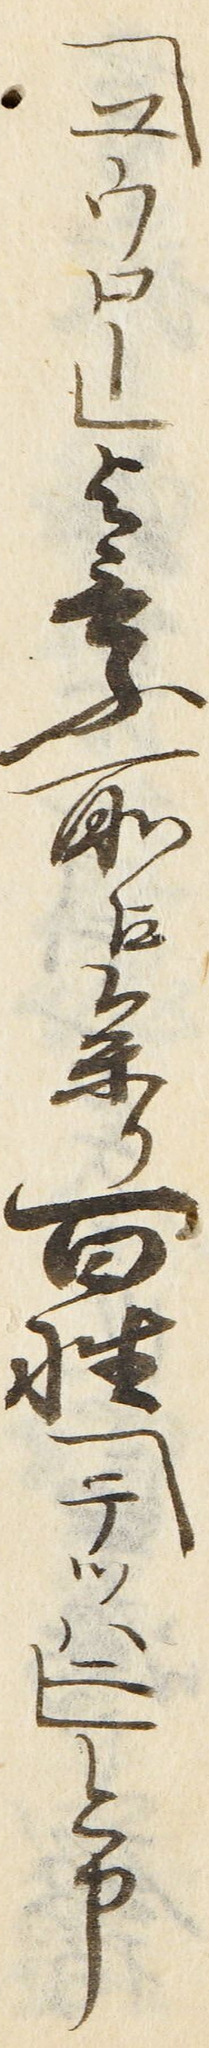「ユウロー」と言ふ所江参り百姓「テツハニ」と申
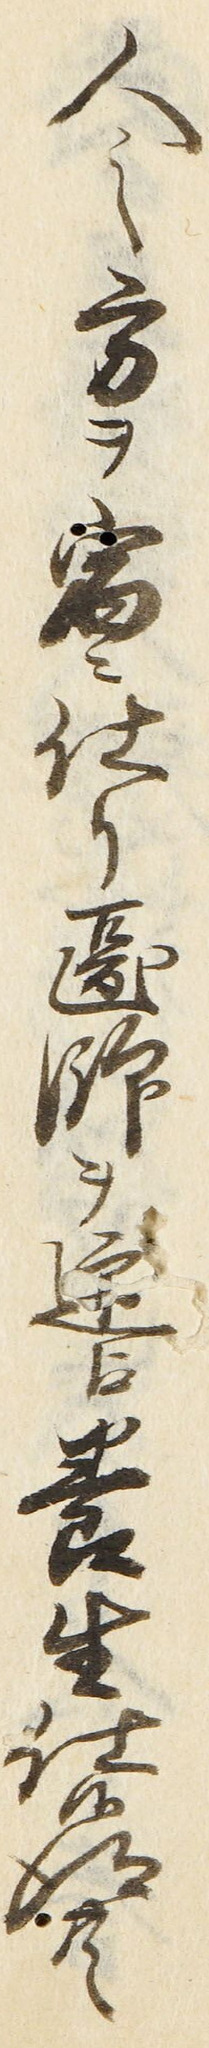人之方ヲ宿ニ仕り醫師ヲ迎江養生仕候得共
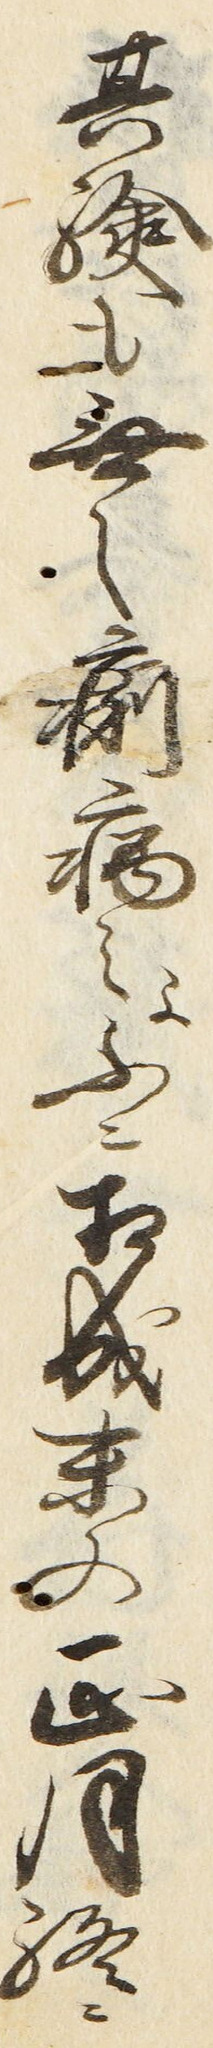其験も無之痢病之よふに相成末の正月終ニ
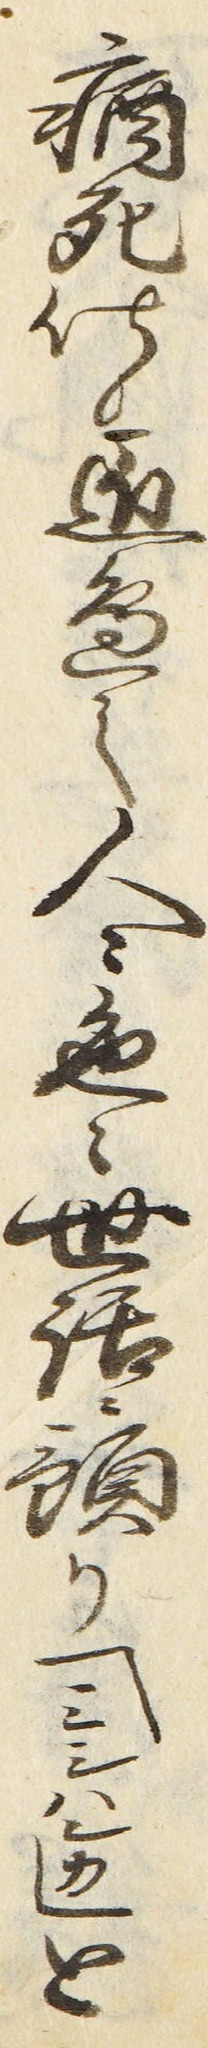病死仕候近邊之人々色々世話ニ預り「ミシハンカ」と
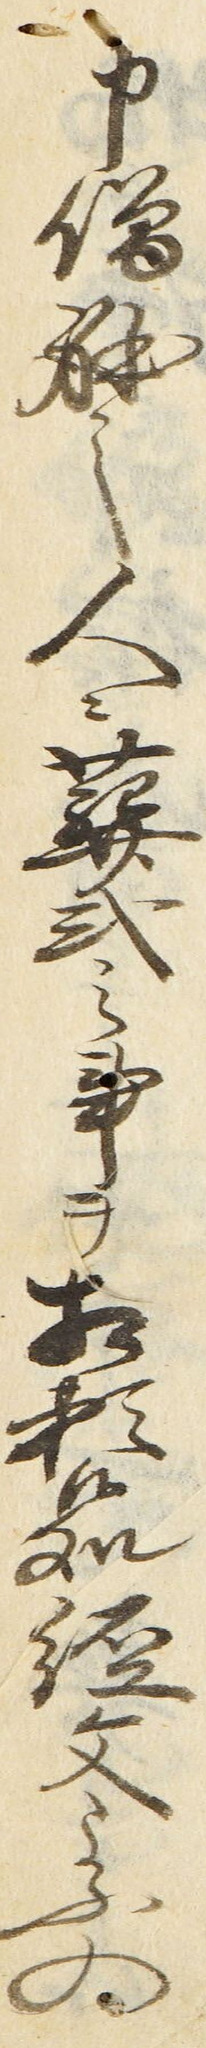申僧躰之人ニ葬式之事ヲ相頼候処經よふの

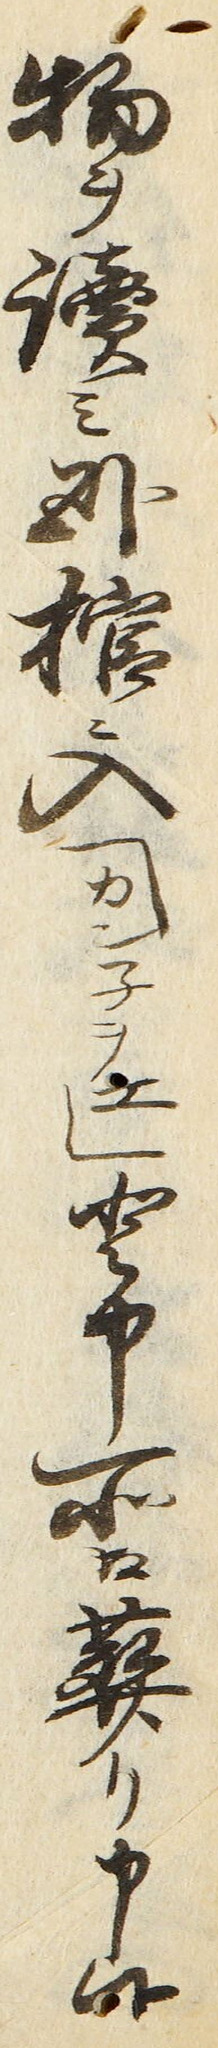物ヲ讀ミ臥棺ニ入「カン子ヲエ」と申所江葬り申候
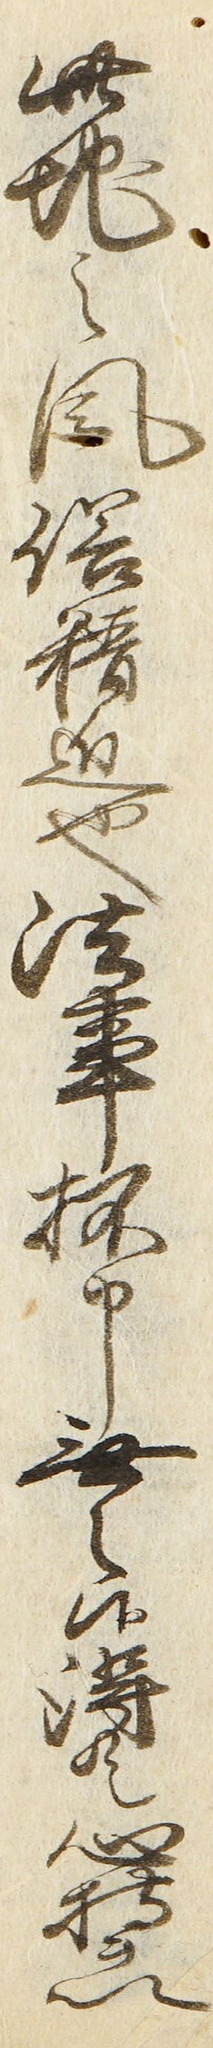此地之風俗精進也法事抔申無之候得共心持ヲ以
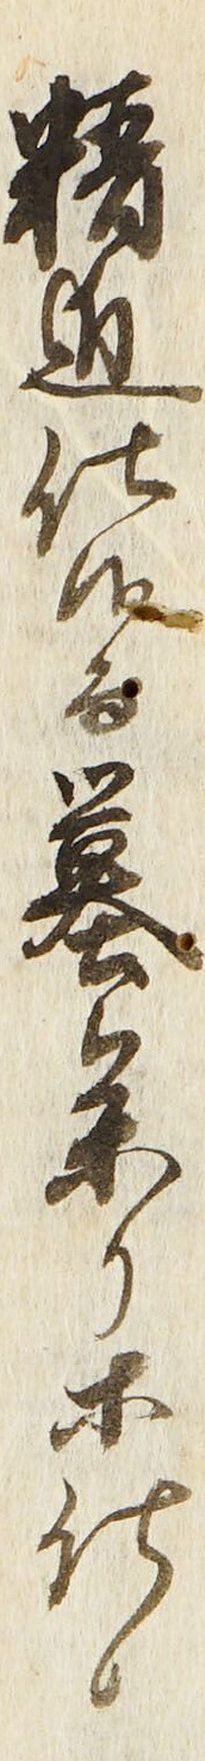精進仕候而墓参り等仕候
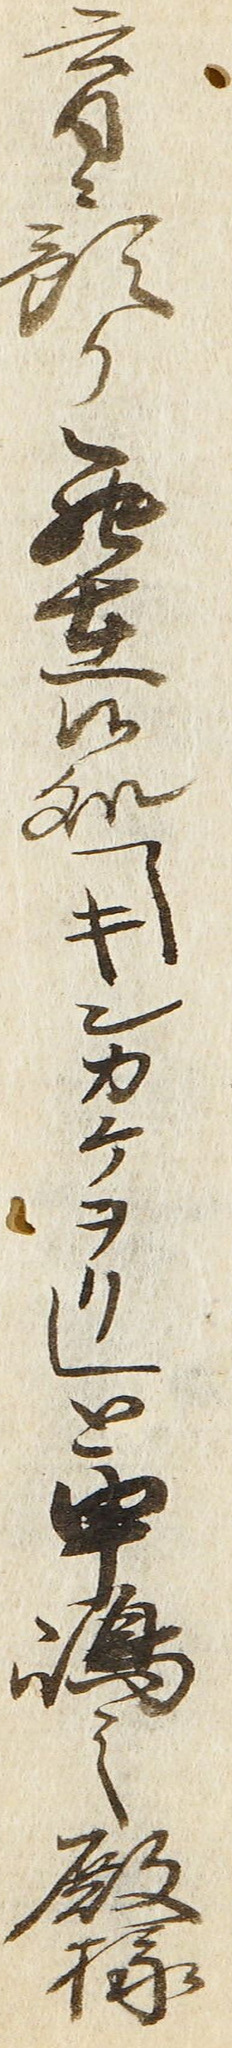育ニ預り罷在候処「キンカケヲリ」と申嶋之殿様
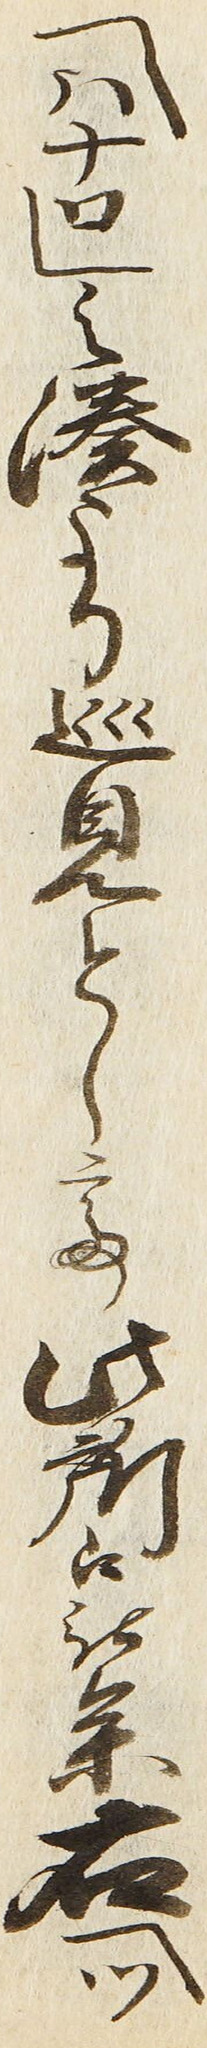「ハナロ」之湊より巡見として此所江被参右「ツ
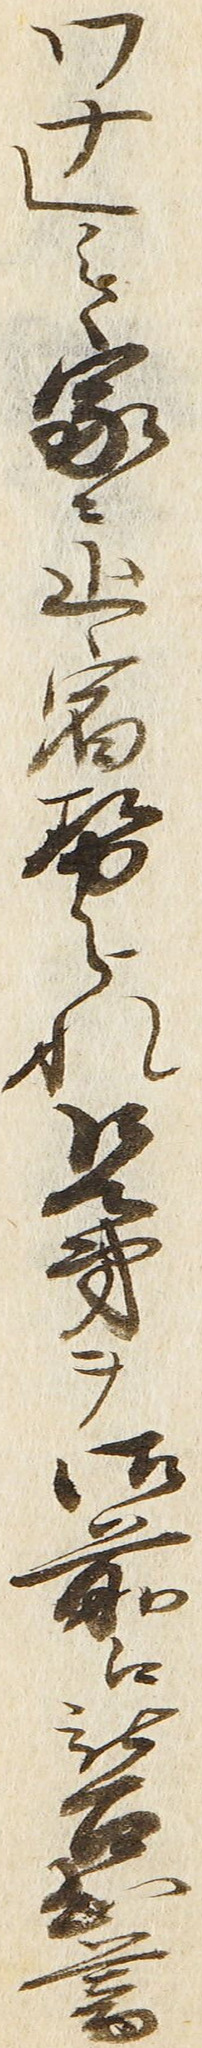ワナ」之家ニ止宿せられ兄弟ヲ御前江召出暮
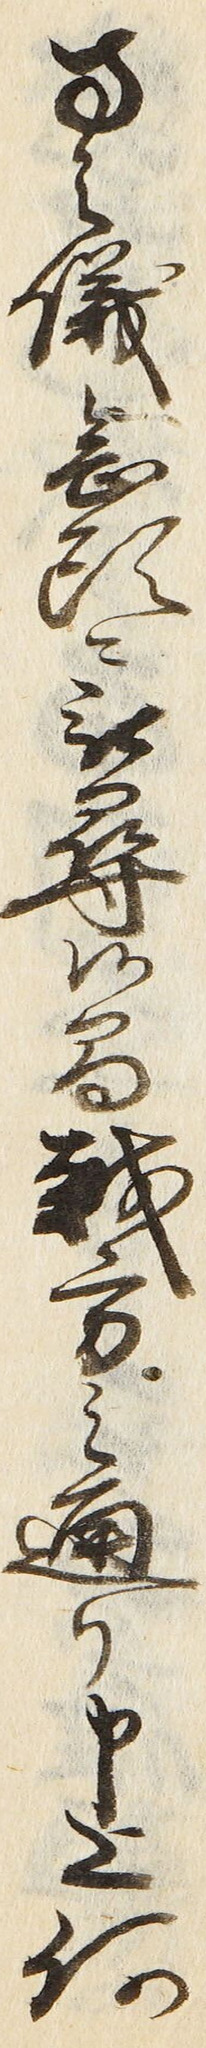方之儀念頭ニ被尋候間裁方之通り申上何
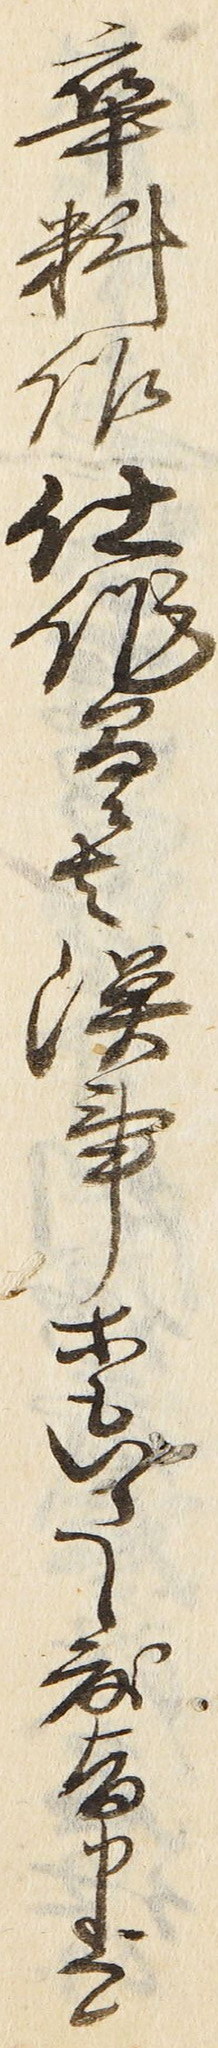卒耕作仕作間ニ者漁事等もいたし度旨申上候
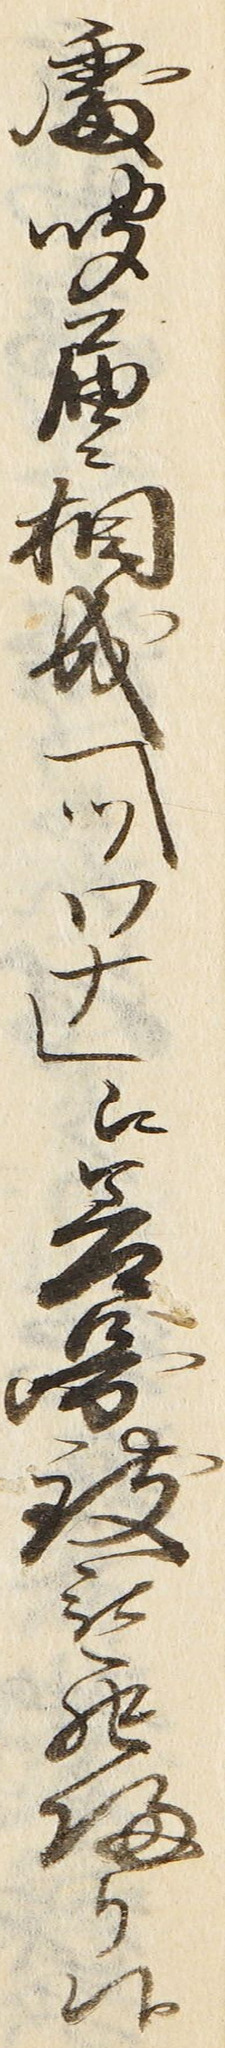處聞届ニ相成「ツワナ」江差圖致被罷帰り候
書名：漂客談寄
